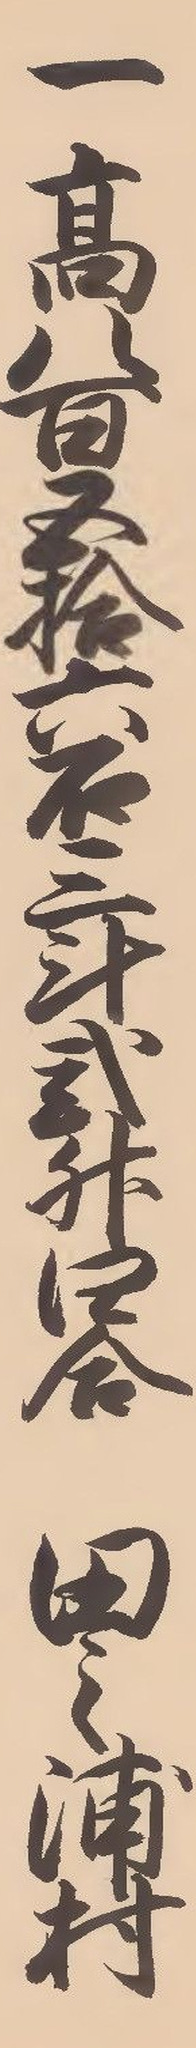一高八百五拾六石三斗弐升四合田之浦村
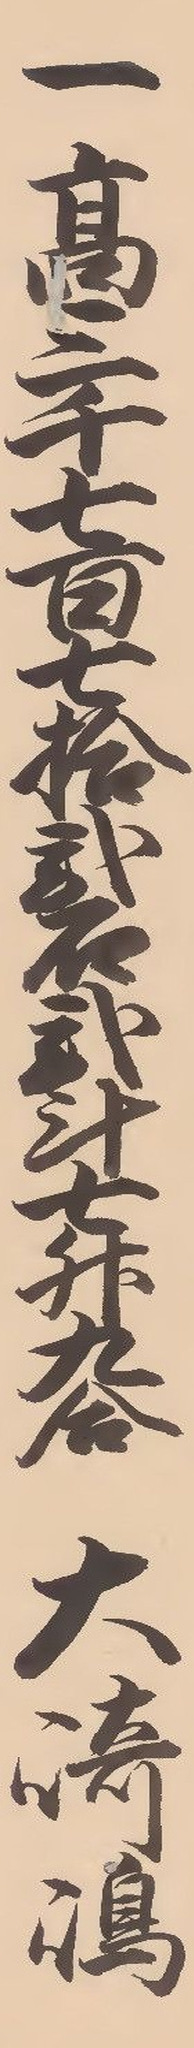一高三千七百七拾弐石弐斗七升九合大崎島
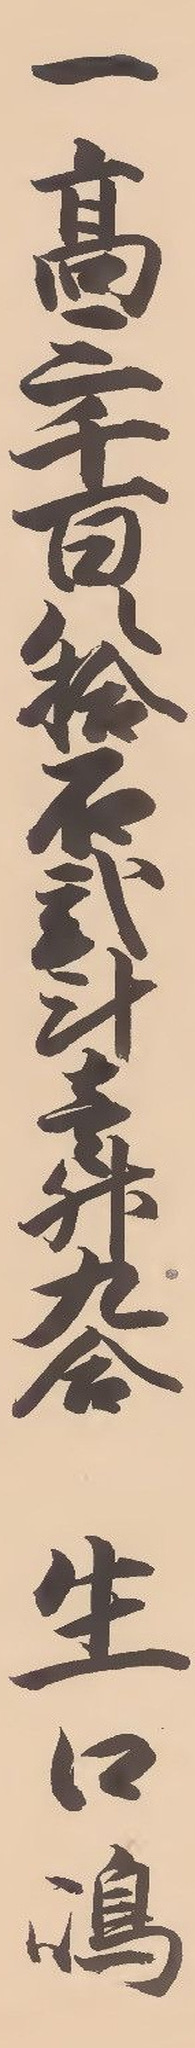一高三千百八拾石弐斗壱升九合生口島

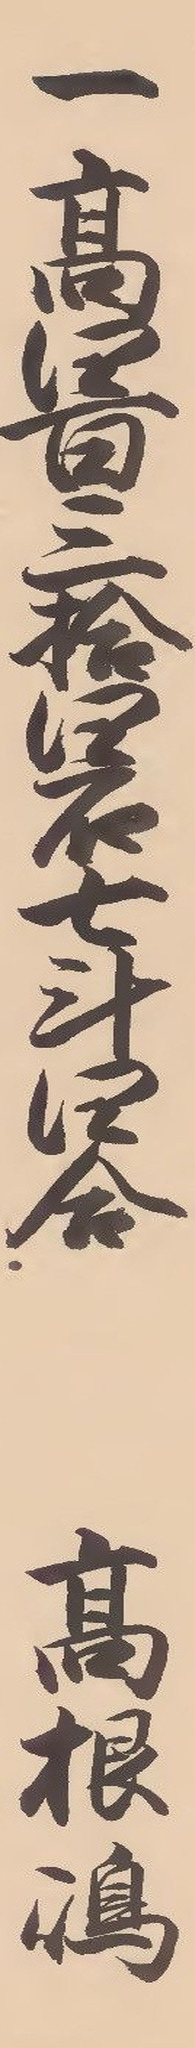一高四百三拾四石七斗四合高根島
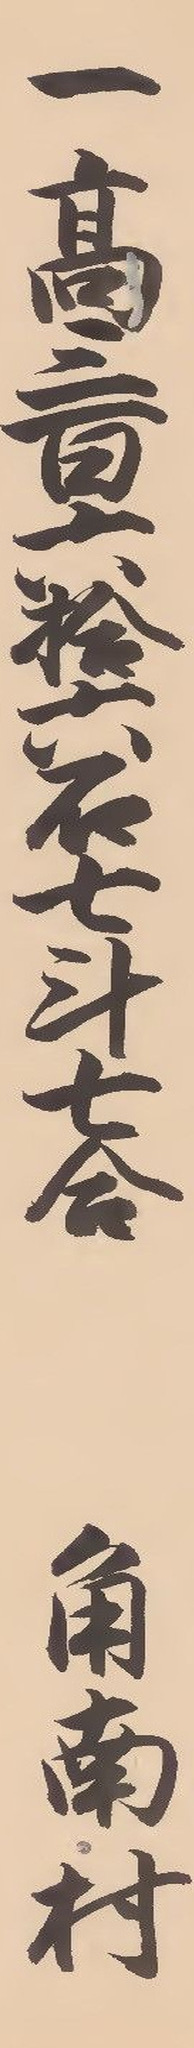一高三百六拾六石七斗七合角南村
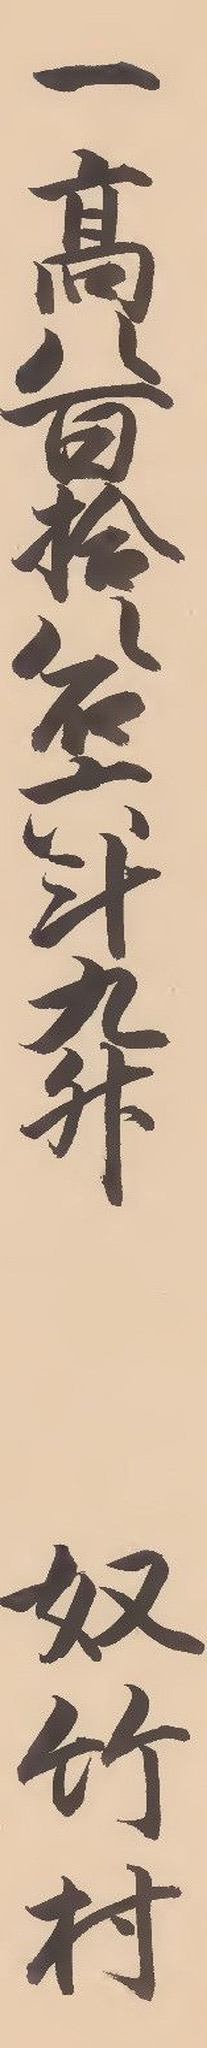一高八百拾八石六斗九升奴竹村
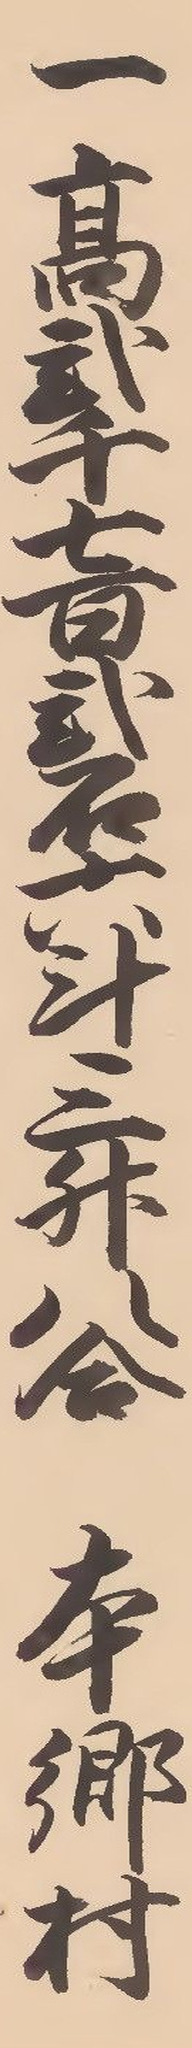一高弐千七百弐石六斗三升八合本郷村
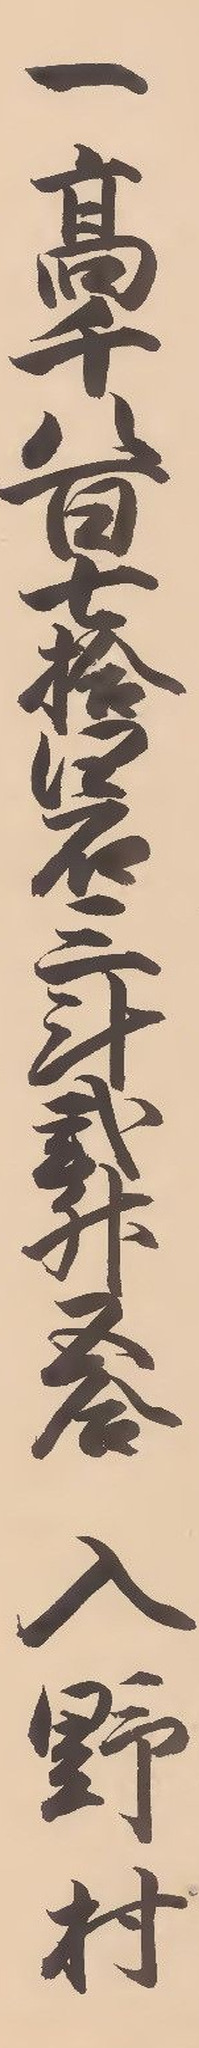一高千八百七拾四石三斗弐升五合入野村
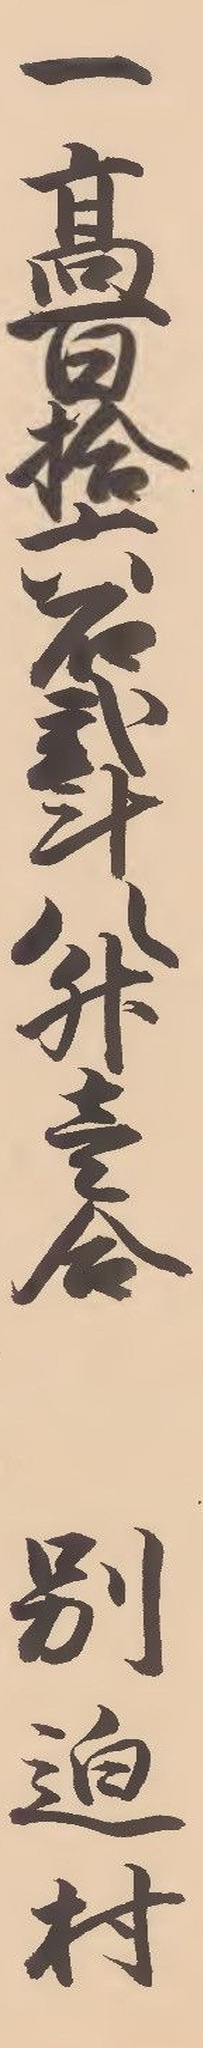一高百拾六石弐斗八升壱合別迫村
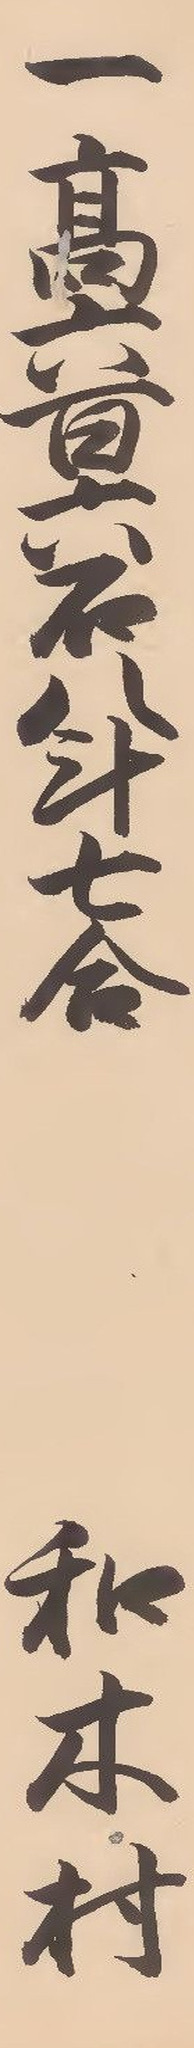一高六百六石八斗七合和木村
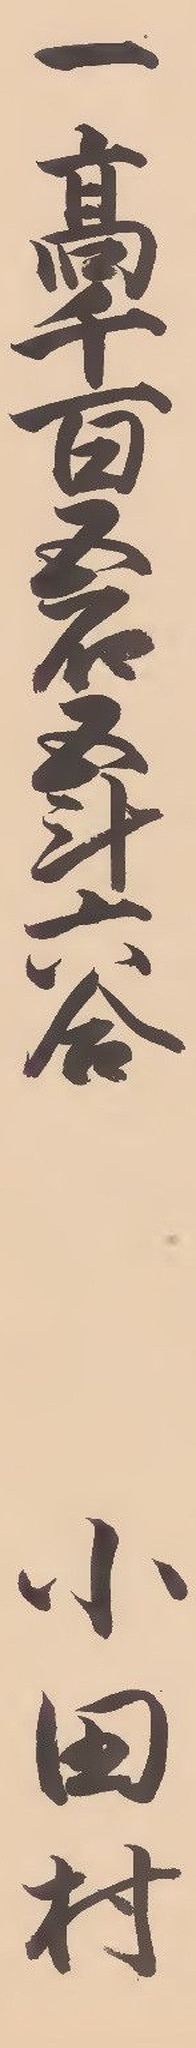一高千百五石五斗六合小田村

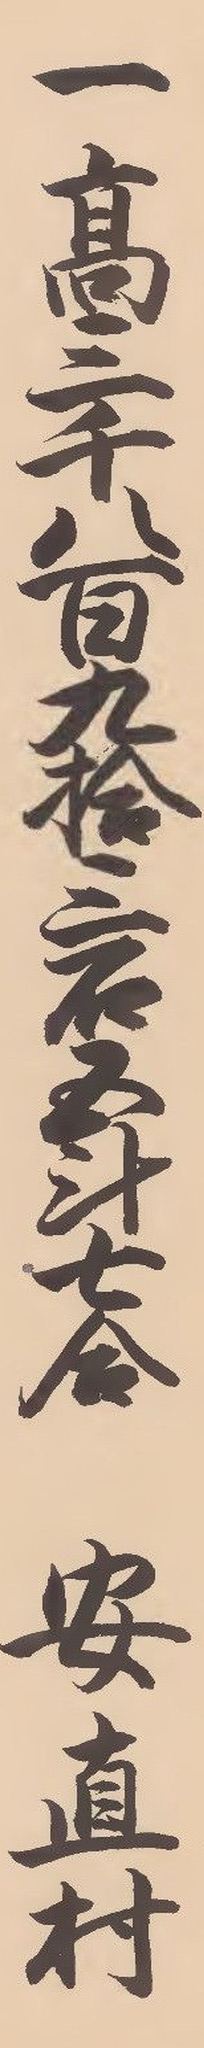一高三千八百九拾三石五斗七合安直村
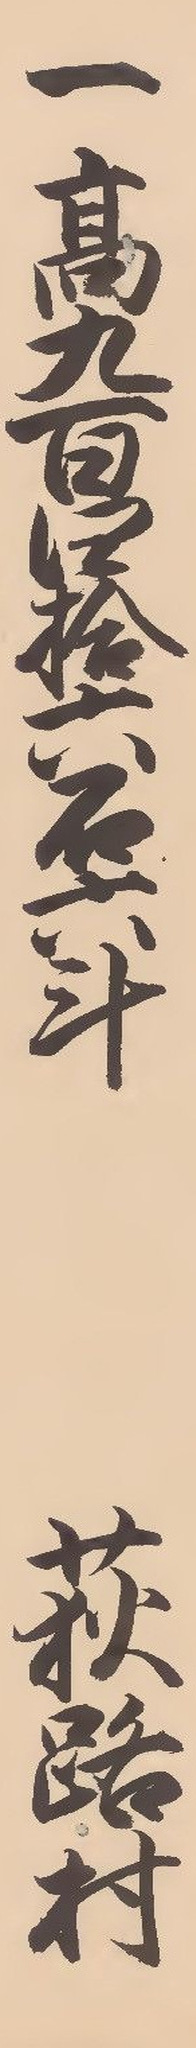一高九百四拾六石六斗荻路村
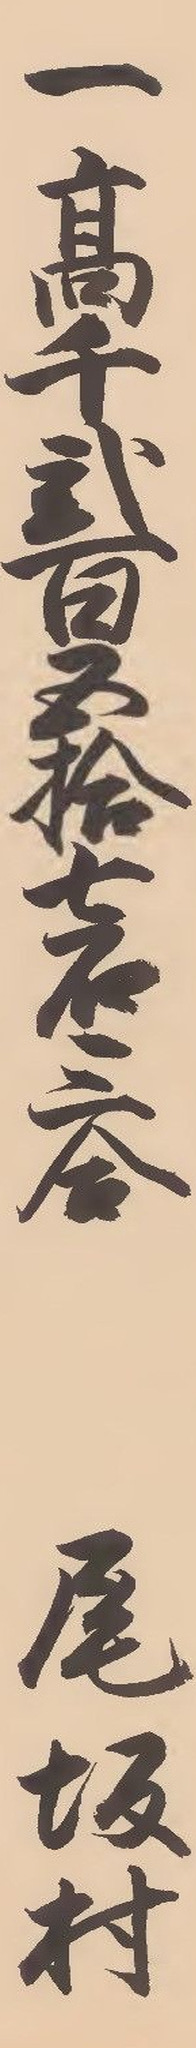一高千弐百五拾七石三合尾坂村
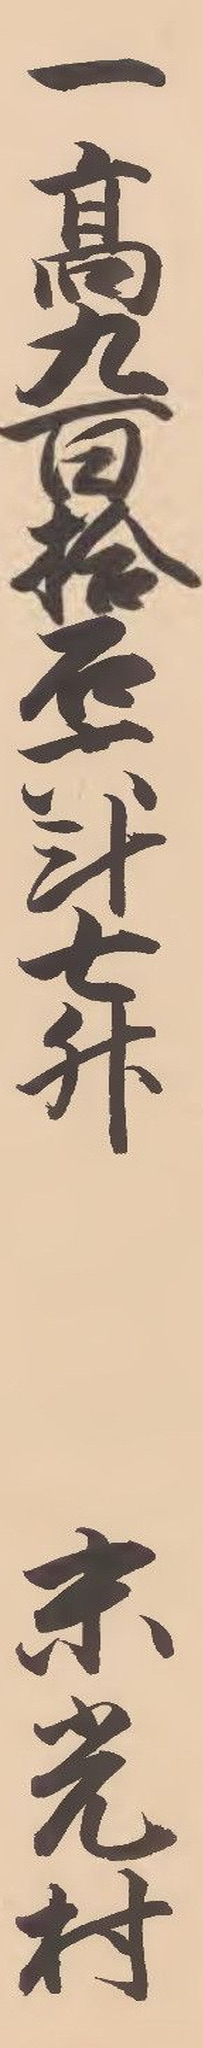一高九百拾石六斗七升末光村
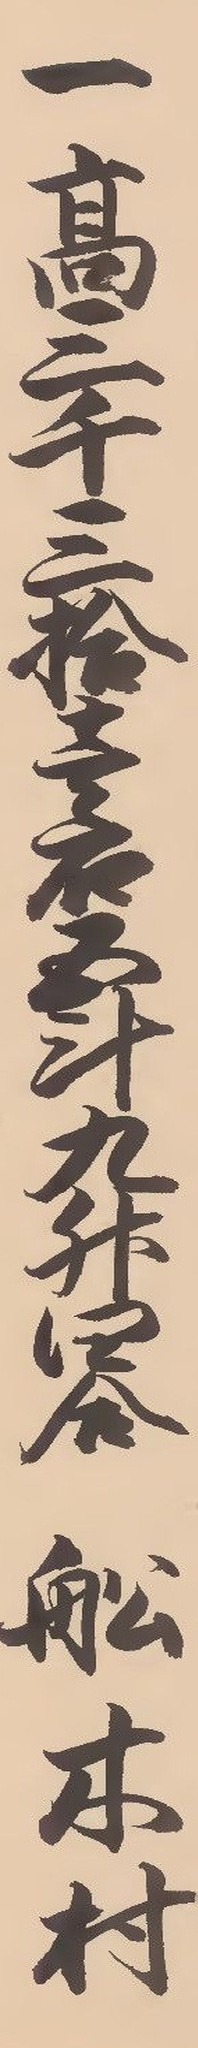一高三千三拾壱石五斗九升四合船木村
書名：安芸国郷帳
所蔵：国立公文書館 National Archives of Japan
